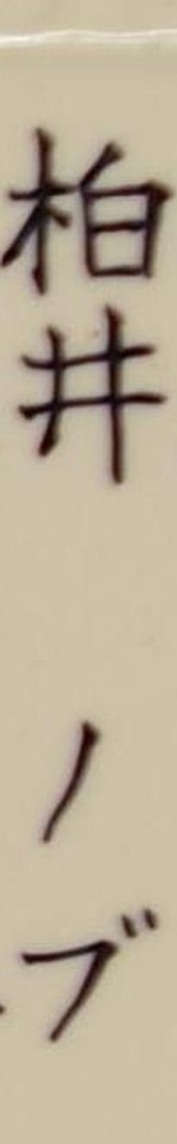柏井ノブ
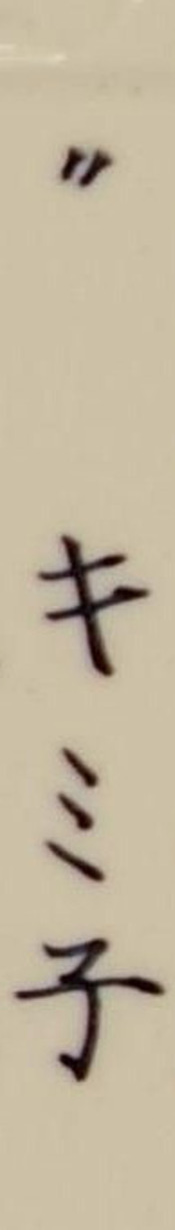キミ子
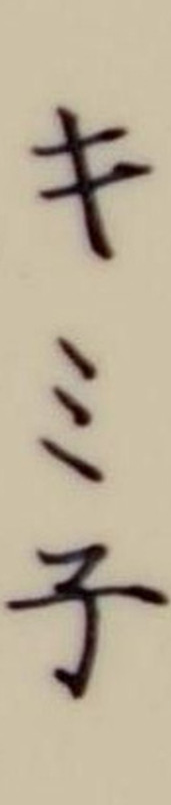キミ子
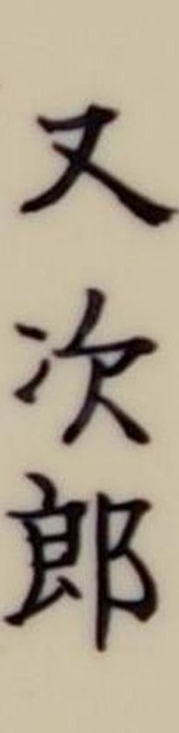又次郎
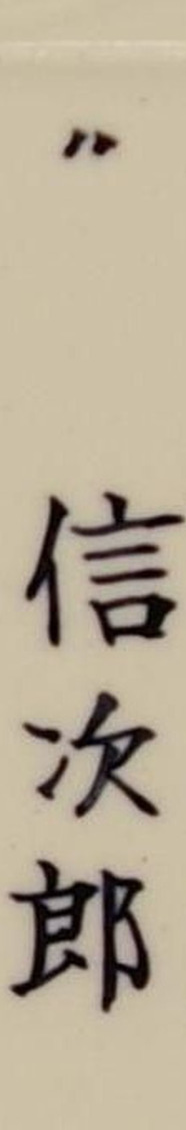信次郎
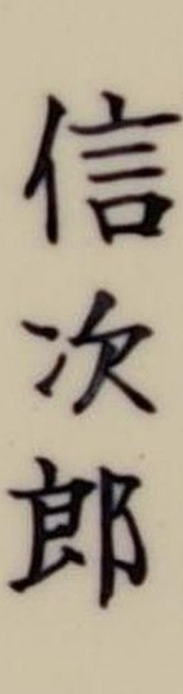信次郎
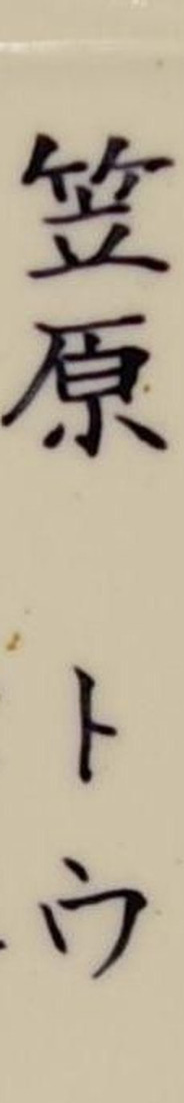笠原トウ
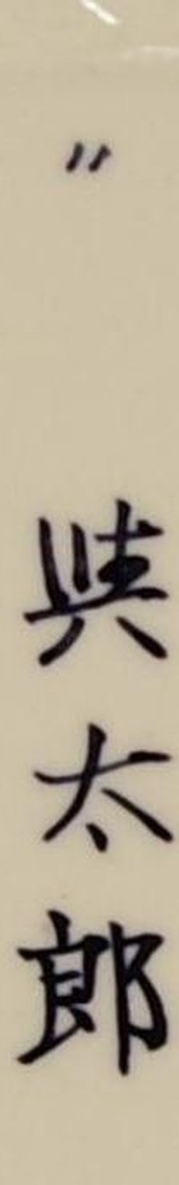与太郎
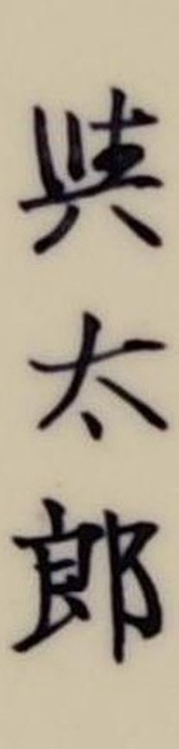与太郎
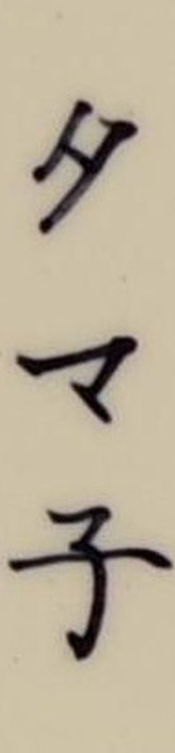タマ子
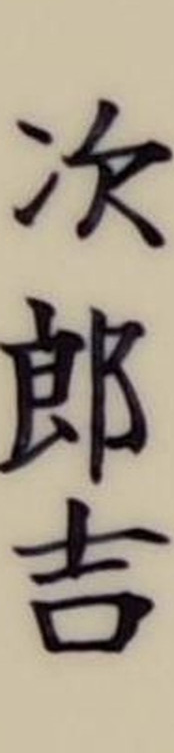次郎吉
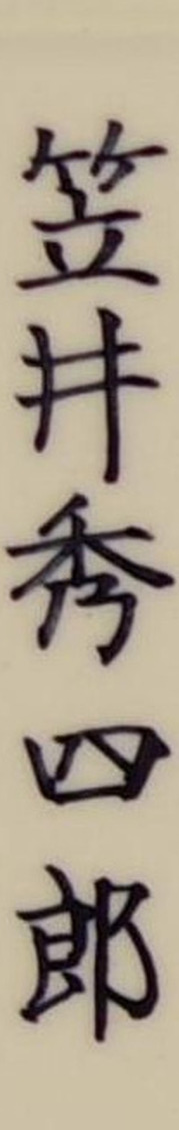笠井秀四郎
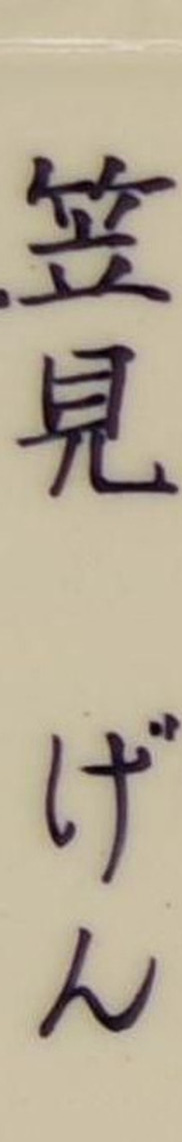笠見げん
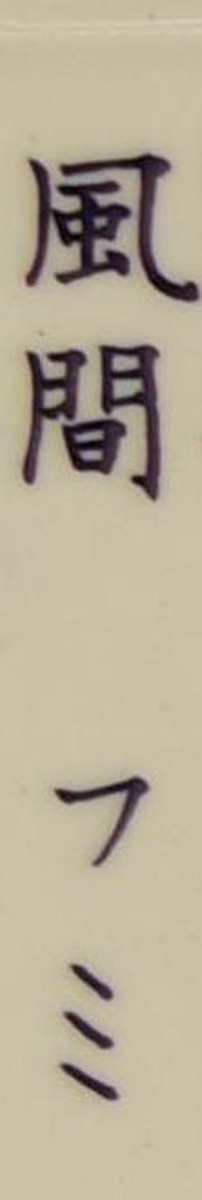風間フミ
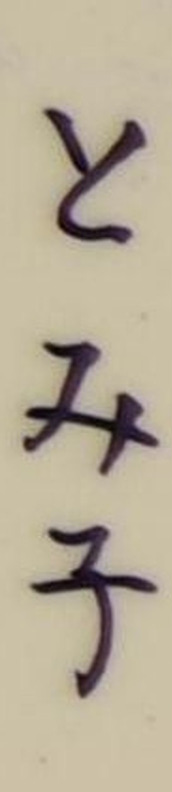とみ子
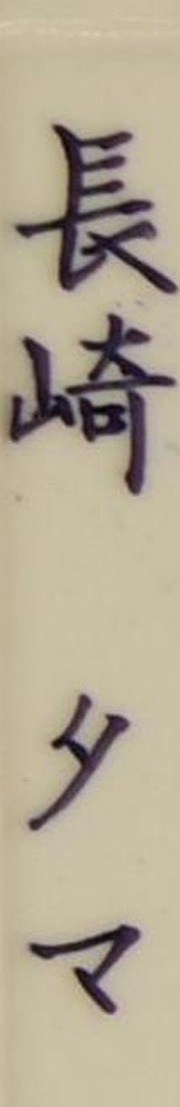長崎タマ
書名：E~L
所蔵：高野山金剛峯寺
